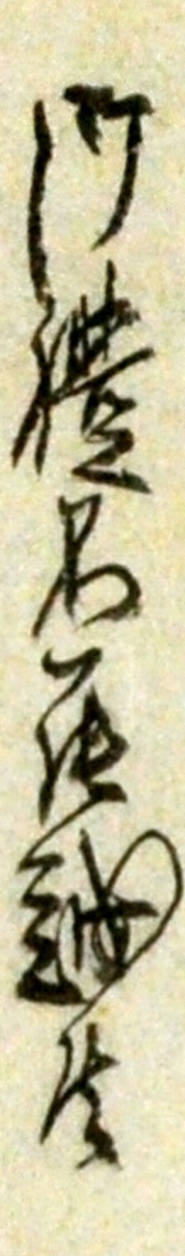御礼不罷越候
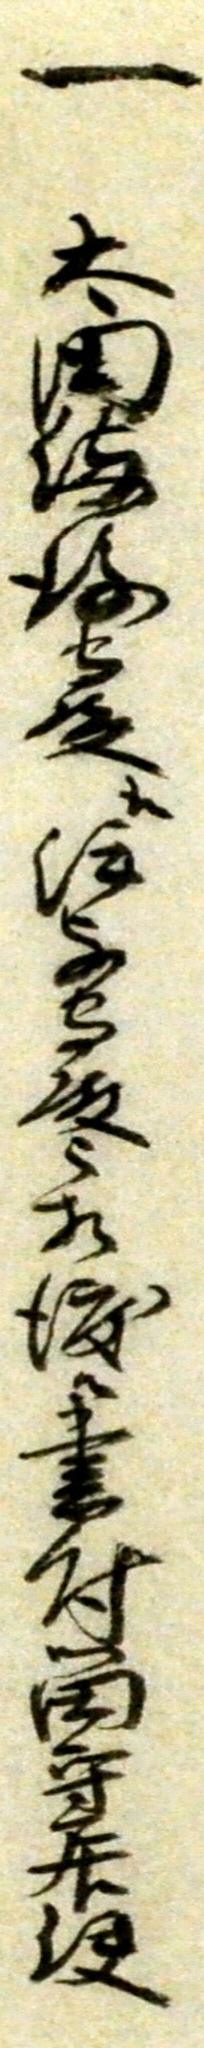一太田備後守殿江伊予守殿被相渡候書付留守居使
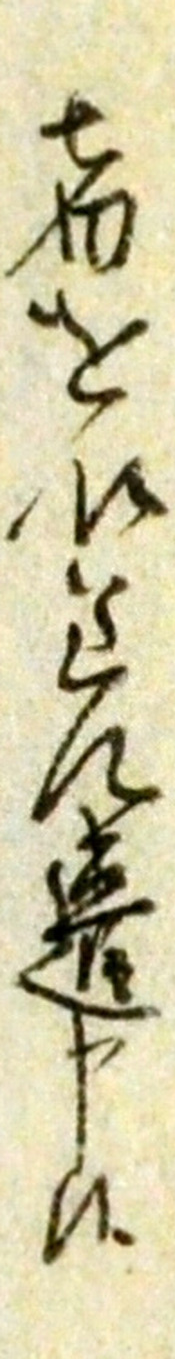者を以差遣申候
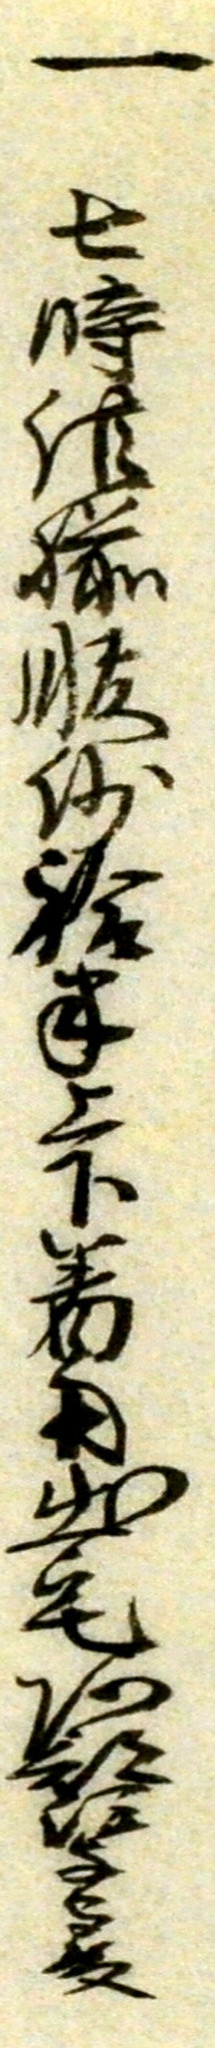一七時供揃服紗袷半上下着用出宅阿部伊与守殿
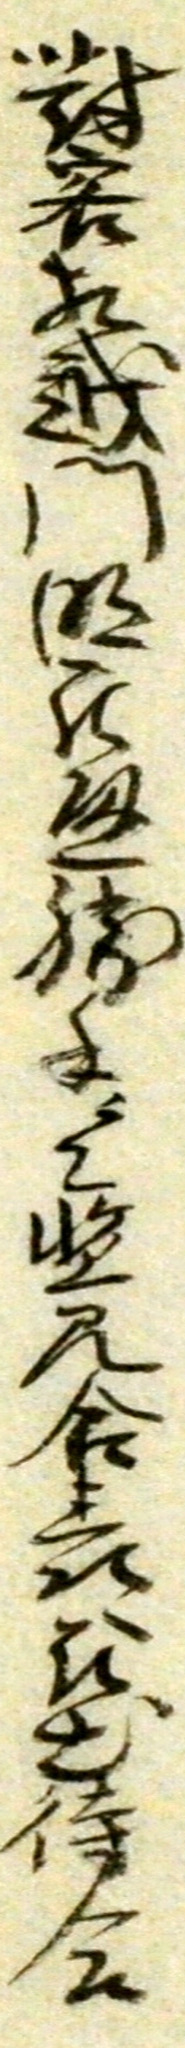対客相越門明罷通勝手ニて暫見合表へ罷出待合
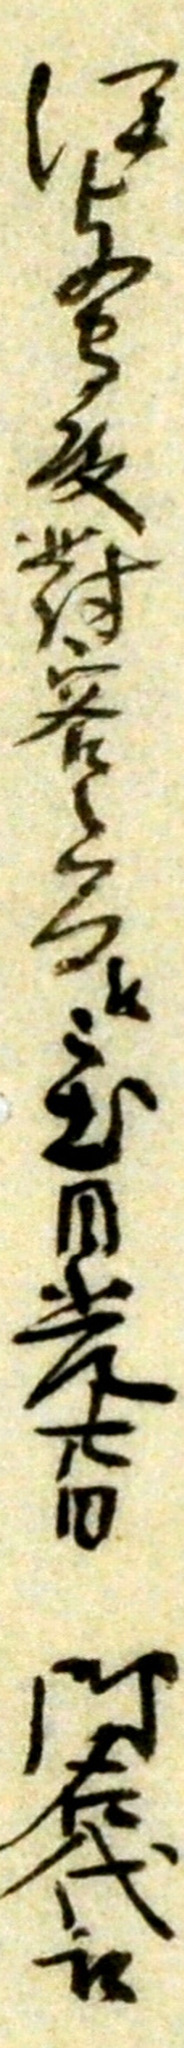伊与守殿対客之間江被出日光廿日御名代被
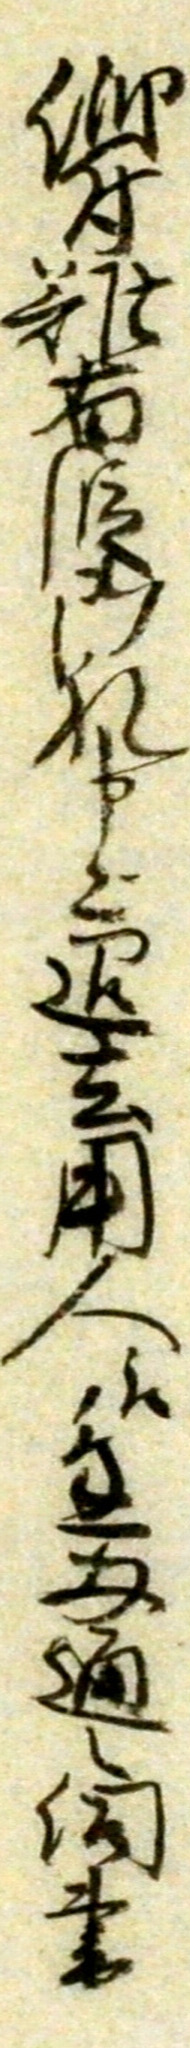仰付難有段御礼申上退去用人江逢両通之伺書
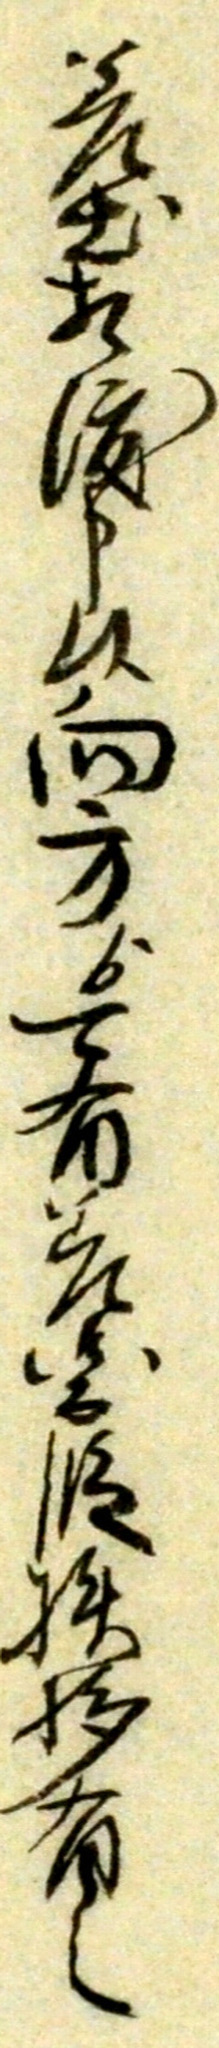差出相渡申候向方ゟ可有差図段挨拶有之
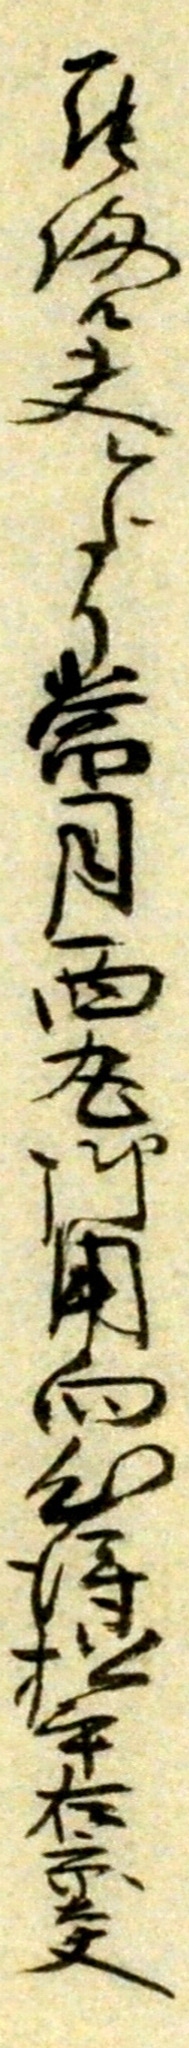罷帰候夫より常月西丸御用向心得松平右京大夫
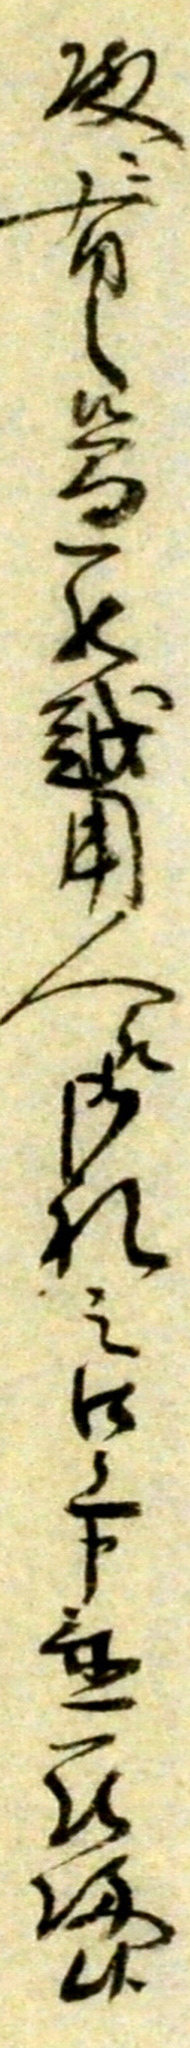故ニ有之候間罷越用人江御礼之口上申置罷帰候

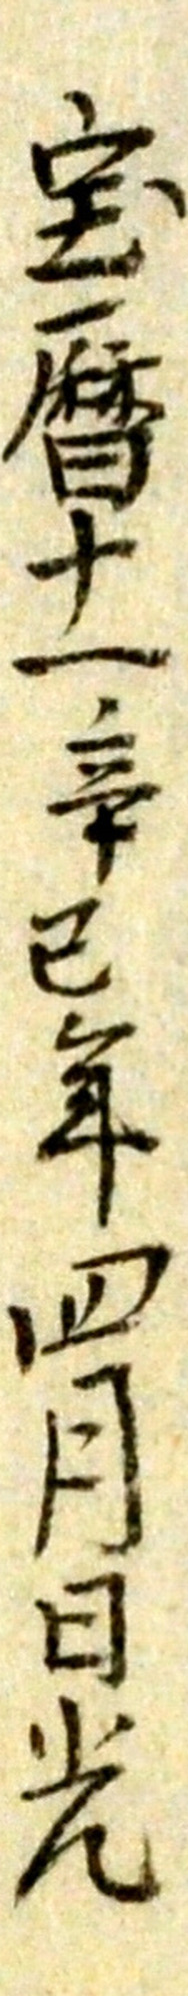宝暦十一辛巳年四月日光
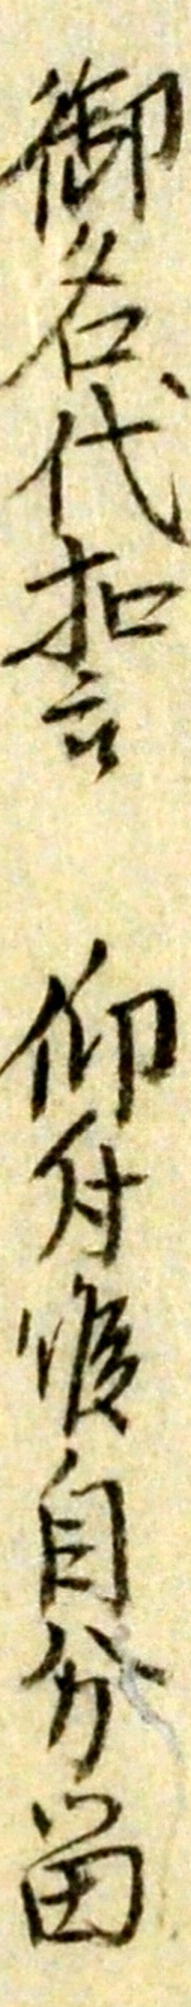御名代扣被仰付候自分留
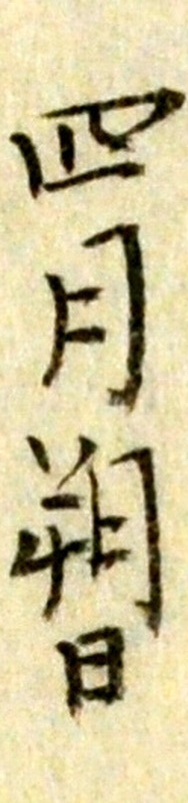四月朔日
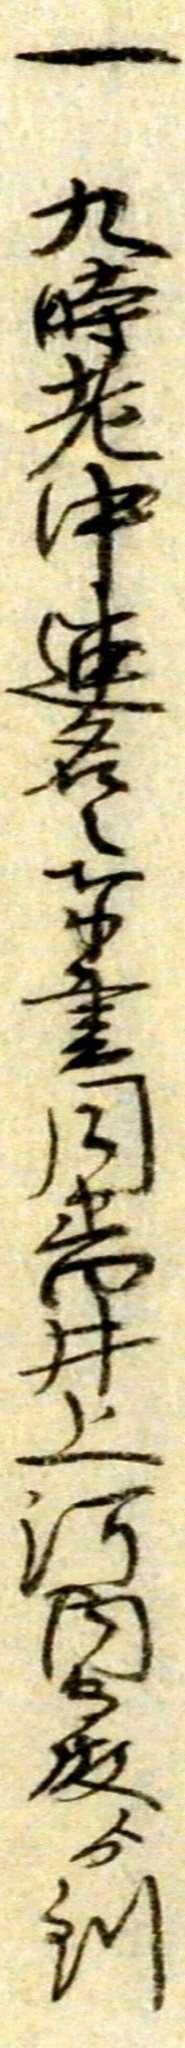一九時老中連名之奉書月番井上河内守殿ゟ到
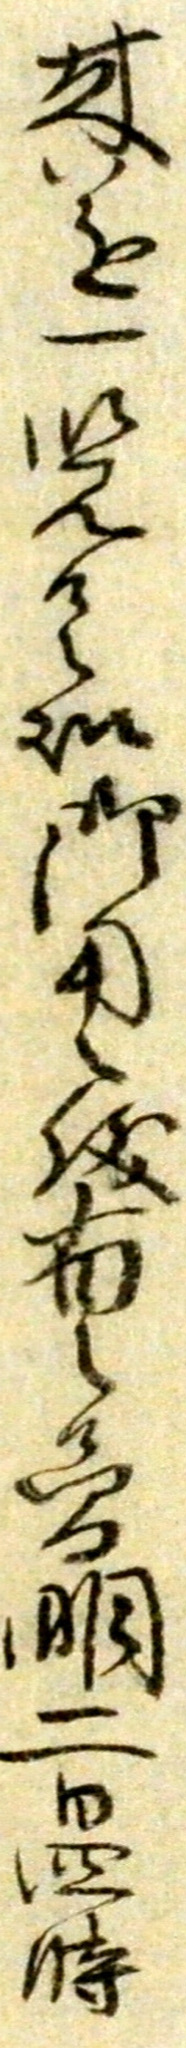来を一覧候之処御用之儀有之候間明二日四時
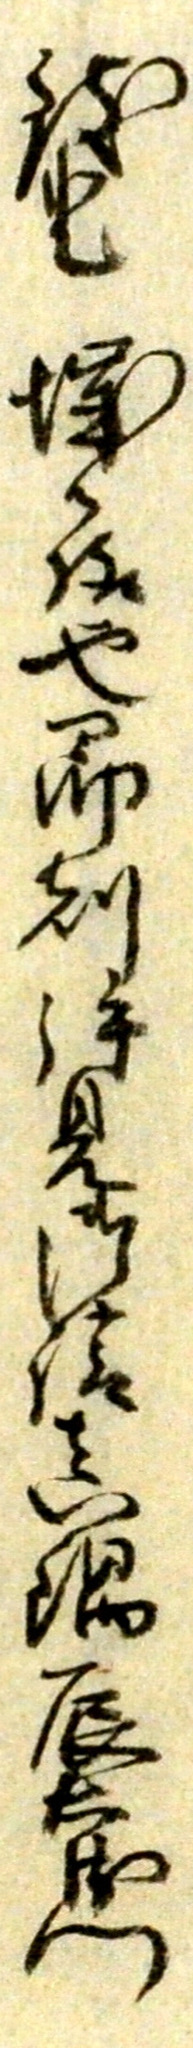致登城候様也即刻拝見御請真鍋辰右衛門
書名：日光御名代相勤候節ノ留
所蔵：伊那市立高遠町図書館・合同会社AMANE
